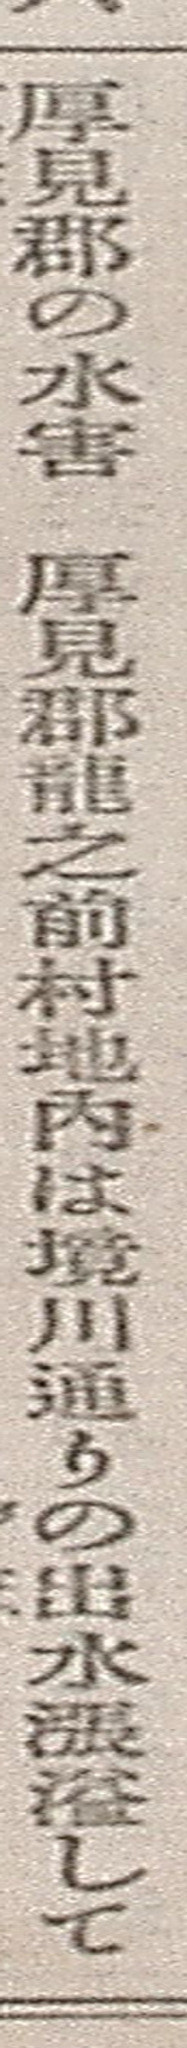厚見郡の水害厚見郡龍之前村地内は境川通りの出水漲溢して
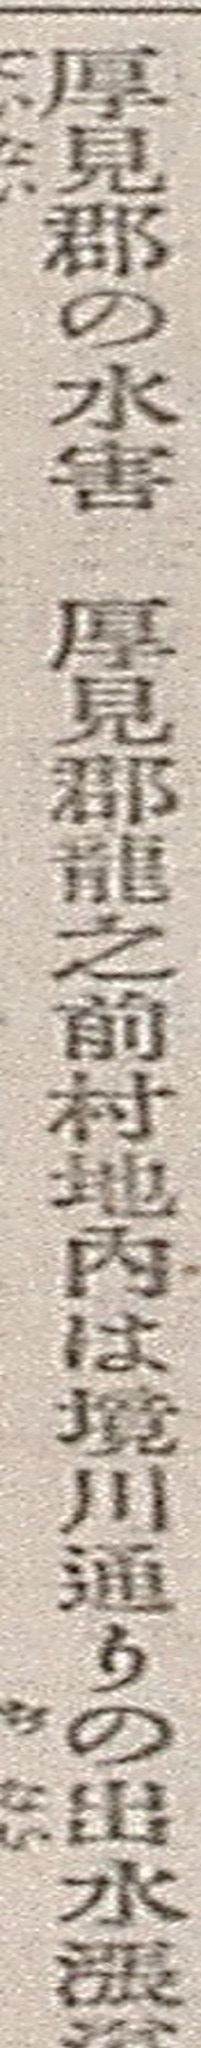厚見郡の水害厚見郡龍之前村地内は境川通りの出水漲溢して
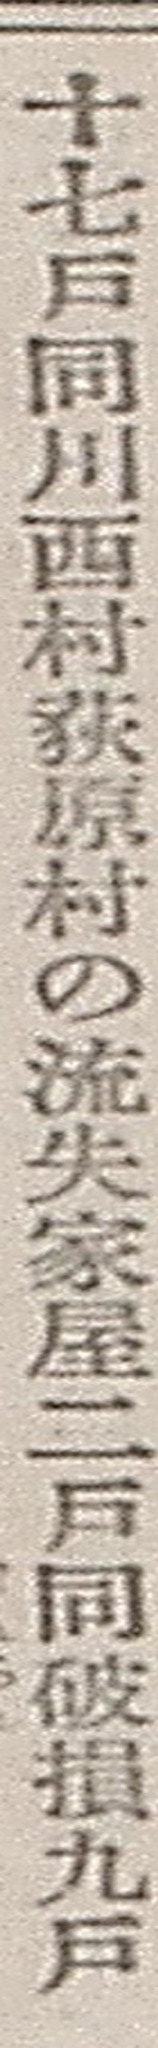十七戸同川西村荻原村の流失家屋二戸同破損九戸
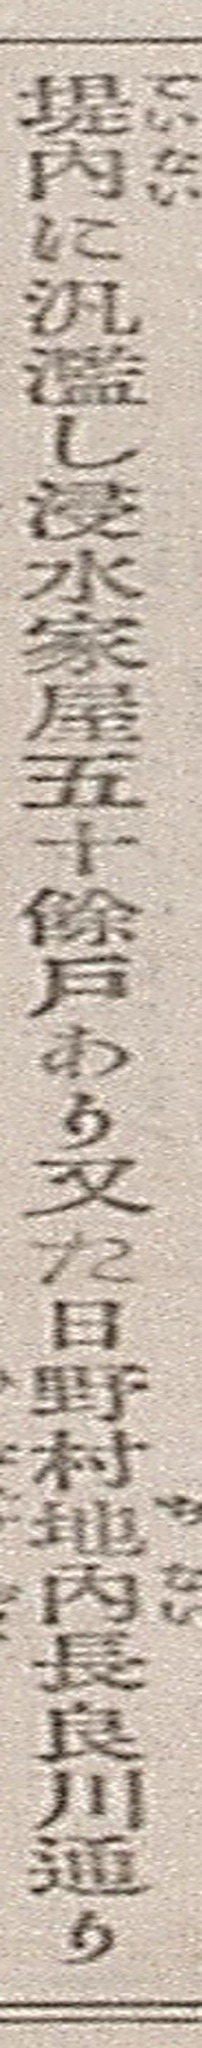堤内に汎濫し浸水家屋五十餘戸あり又た日野村地内長良川通り
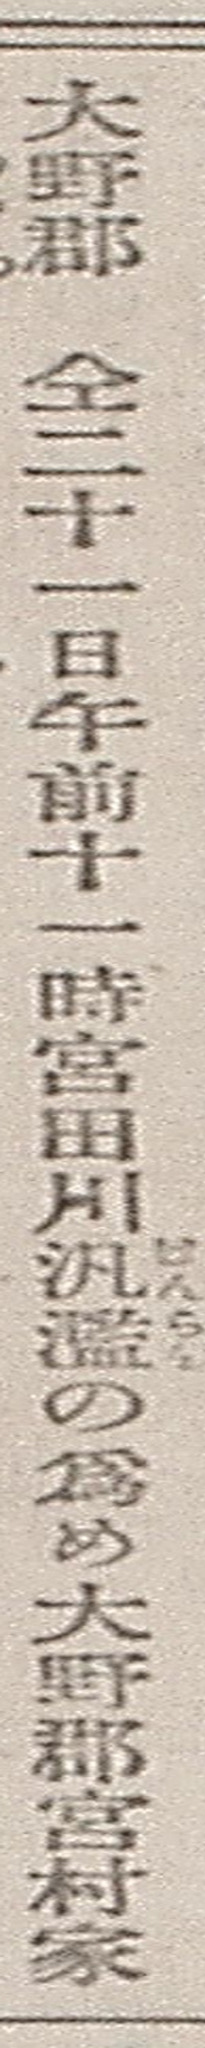大野郡同二十一日午前十一時宮田川汎濫の為め大野郡宮村家
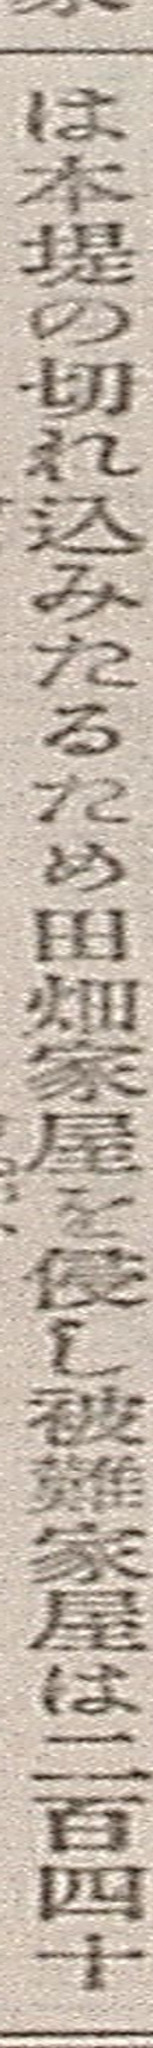は本堤の切れ込みたるため田畑家屋えお侵し避難家屋は二百四十
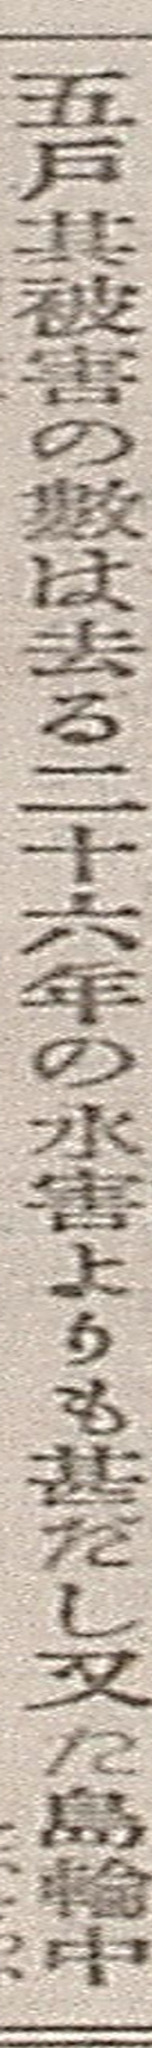五戸其被害の数は去る二十六年の水害よりも甚だし又た島輪中
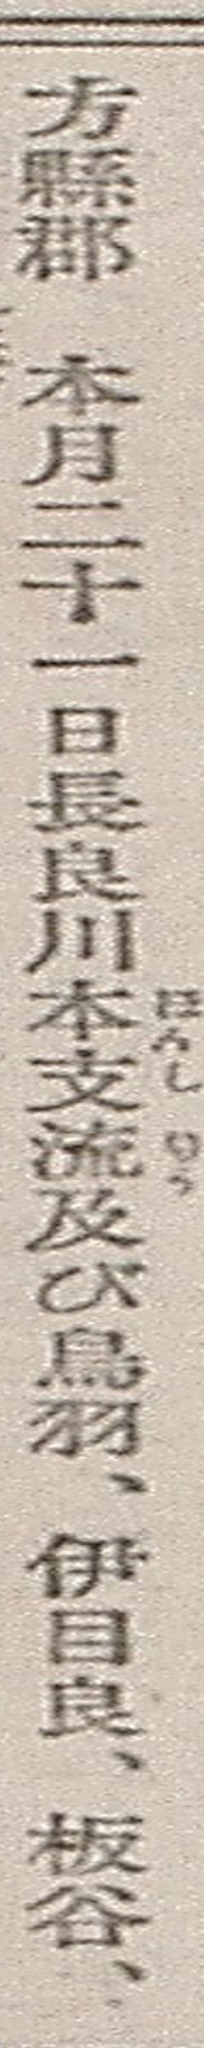方縣郡本月廿一日長良川本支流及び鳥羽、伊目良、板谷、
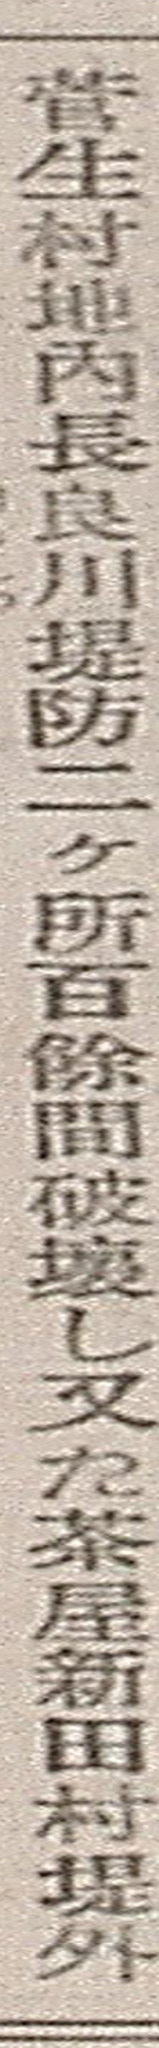菅生村地内長良川堤防二ヶ所百餘間破壊し又た茶屋新田村堤外
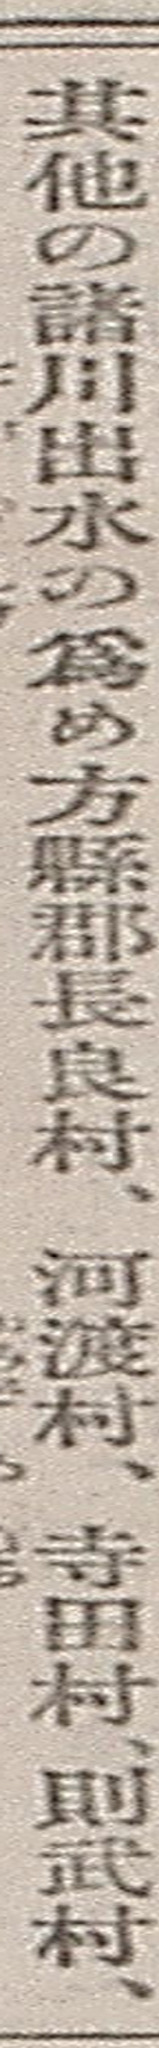其他の諸川出水の為め方縣郡長良村、河渡村、寺田村、則武村、
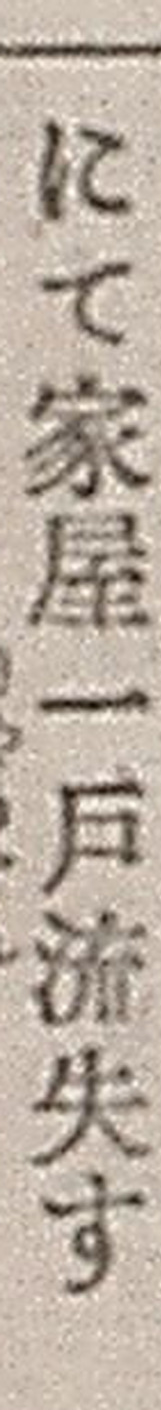にて家屋一戸流失す
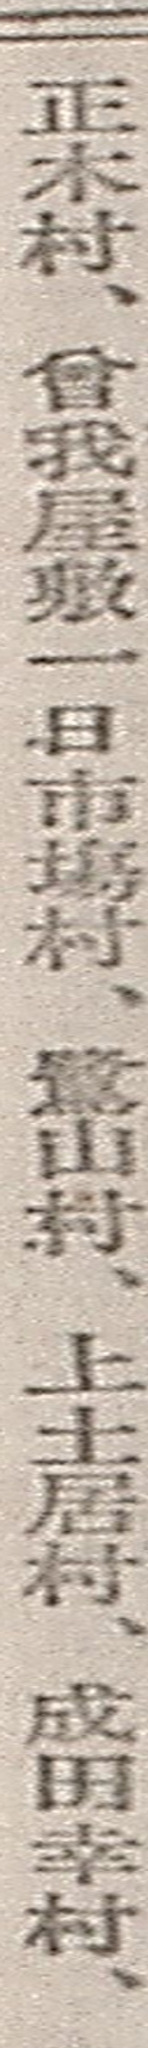正木村、曽我屋敷一日市場村、鷲山村、上土居村、成田幸村、
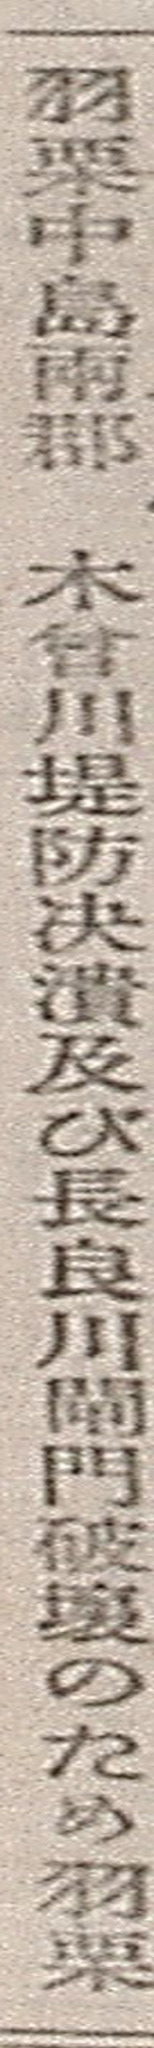羽栗中島両郡木曽川堤防决潰及び長良川閘門破壊の為羽栗
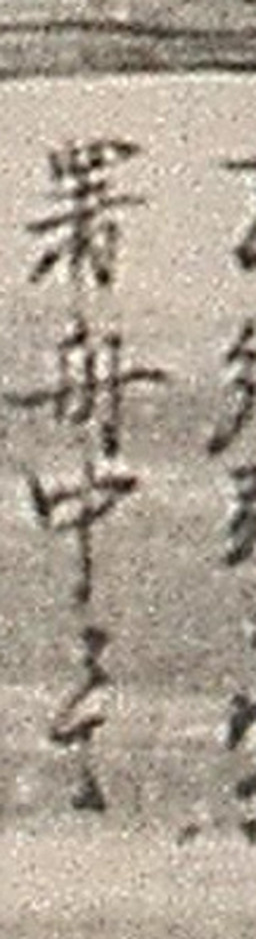署舟中にて
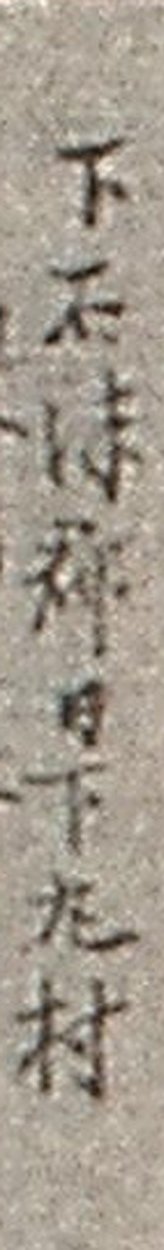下石津郡日下丸村

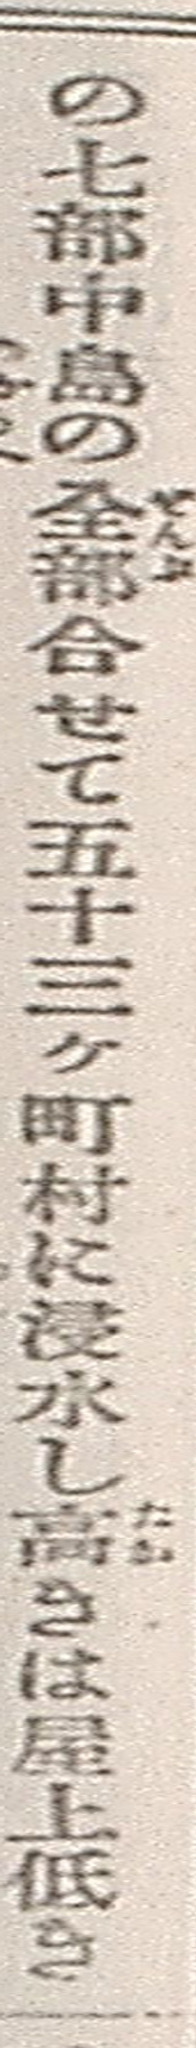の七部中島の全部合せて五十三ヶ町村に浸水し高きは屋上低き
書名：風俗畫報臨時増刊第百二十六號　洪水被害録（中）
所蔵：東京大学地震研究所図書室 Earthquake Research Institute Library, The University of Tokyo, JAPAN
